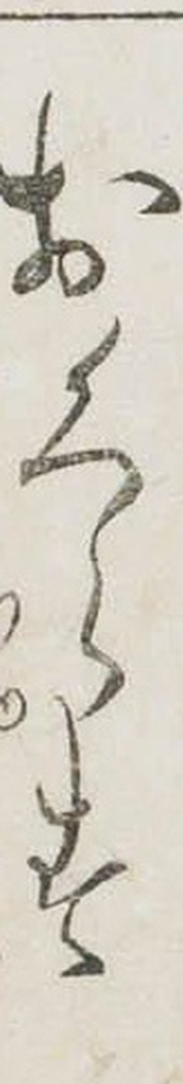おくらす
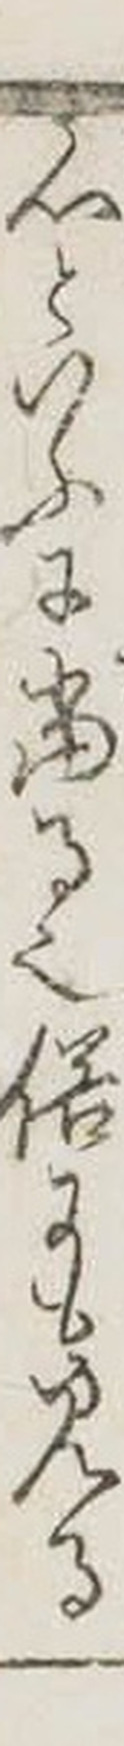心といふに当る也俗にも見る
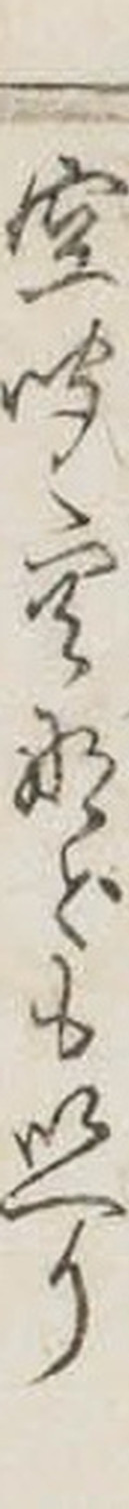空聞空などもいへり
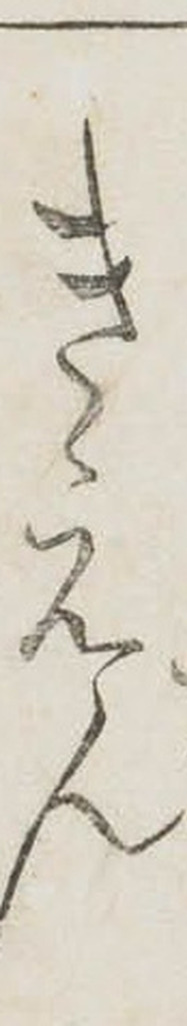きえん
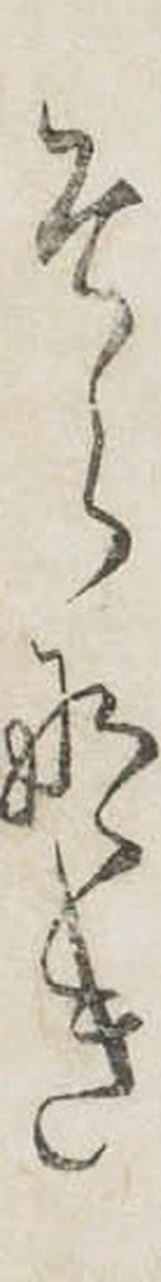そらなき

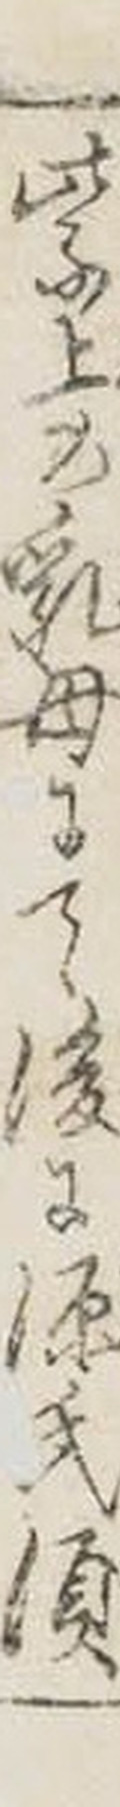紫上の乳母にて後に源氏須
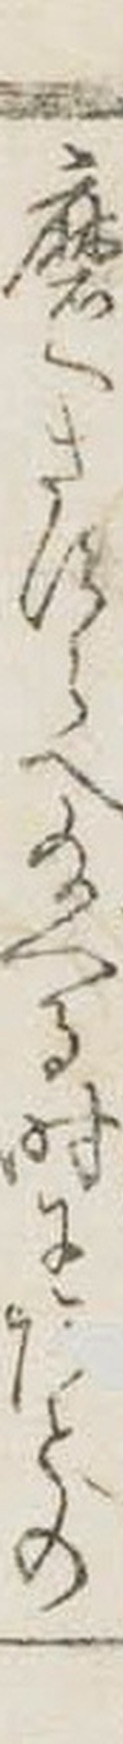磨へさすらへ給へる時にあとの
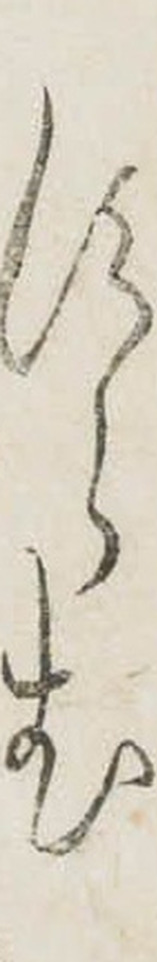すらむ
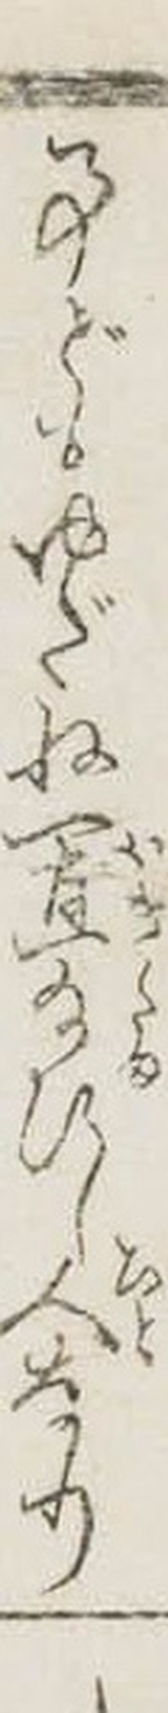事どもゆだね置給ひし人なり
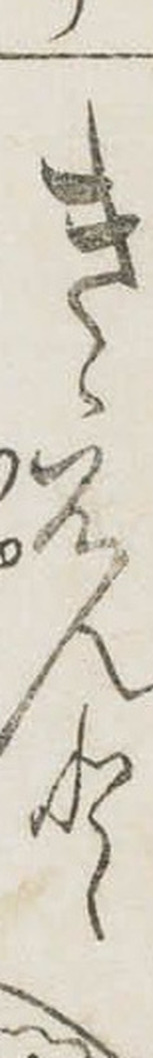きえんと
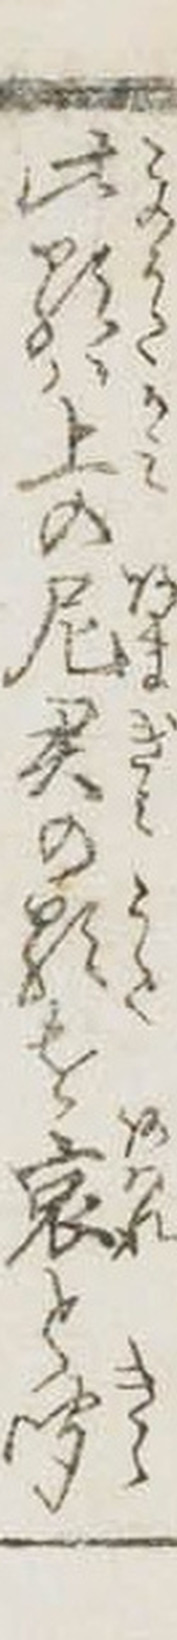此歌は上の尼君の歌を哀と聞
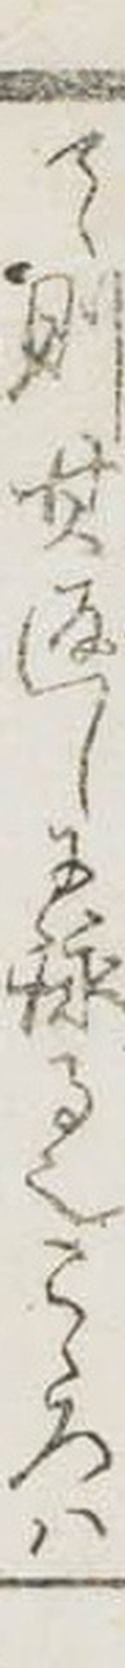て則其返しに詠る也こゝろは
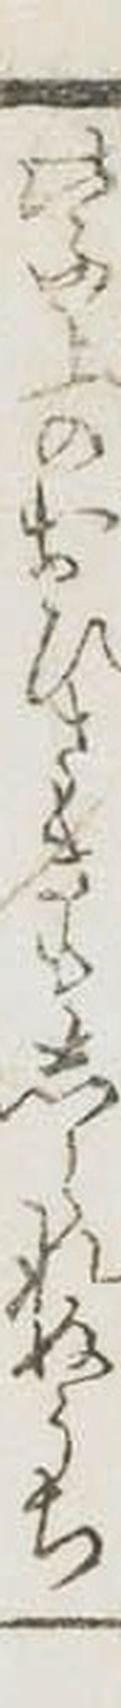紫上のおひさきもしられぬうち
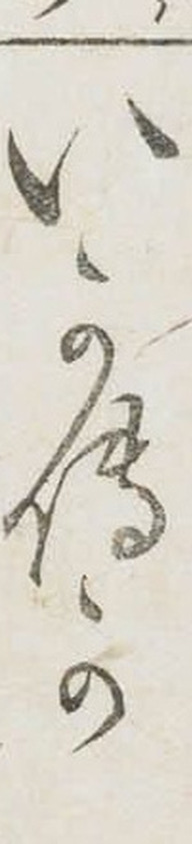いかてか
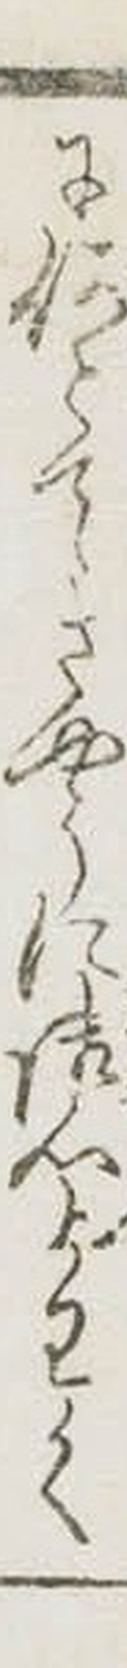に何とてさやうに御心よわく
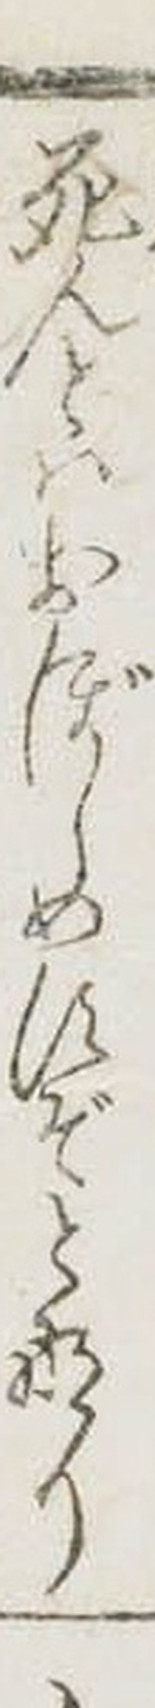死んとはおぼしめすぞとなり
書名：源氏百人一首
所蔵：東京学芸大学教育コンテンツアーカイブ
